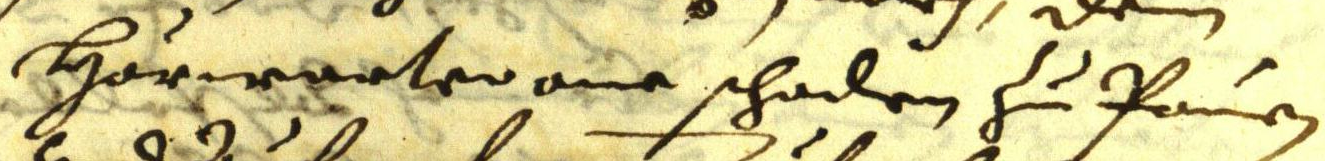Hōrwarter one schaden Zū Paūen.
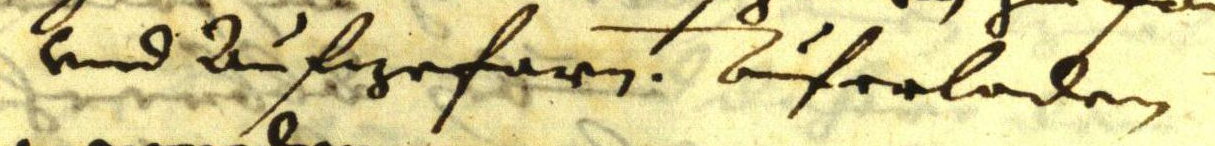vnd Aūfzefarn. Aūferladen
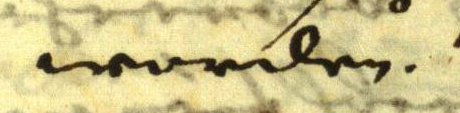worden.
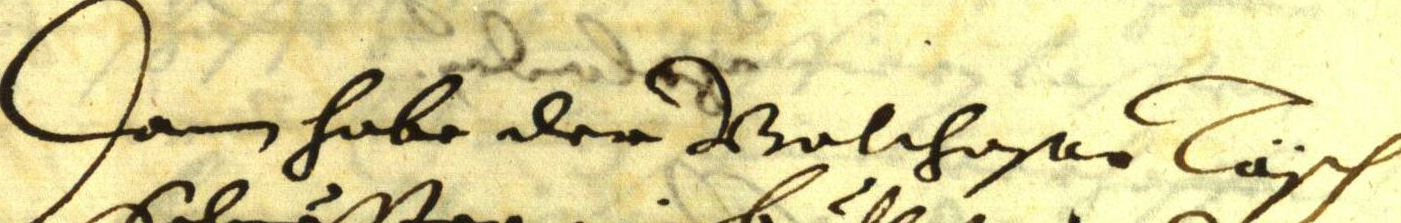Dann habe der Balthasar Täsch
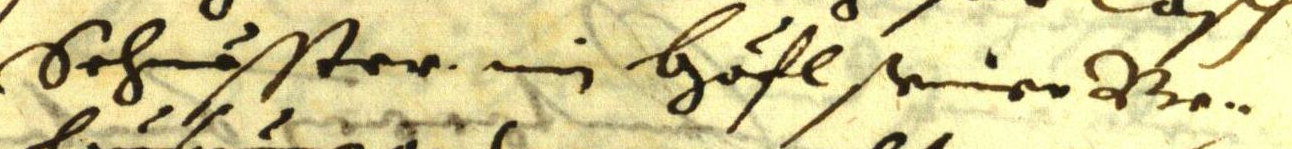Schūesster. im Hōfl seiner Be¬
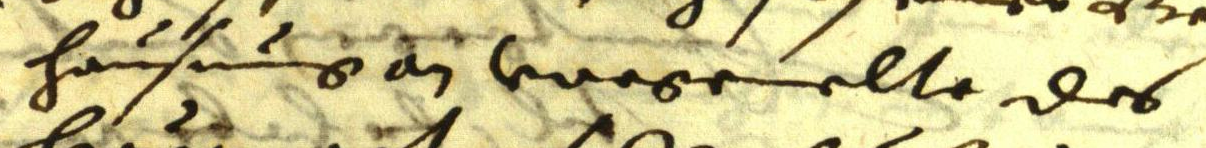haūsūng an vorgemelte des
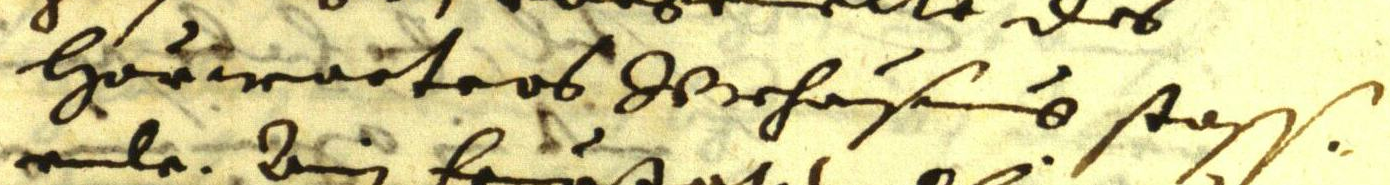Hōrwarters Behaūsūng stoss¬
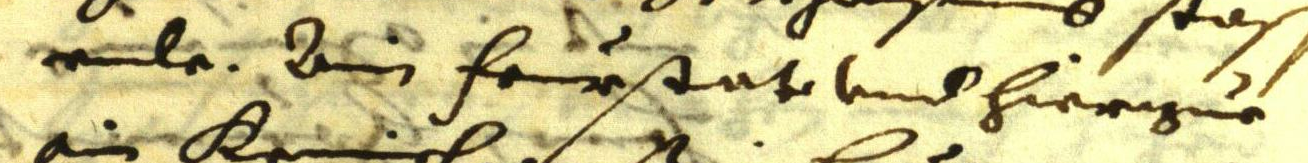ende. Ain feūrstat vnd hierzūe
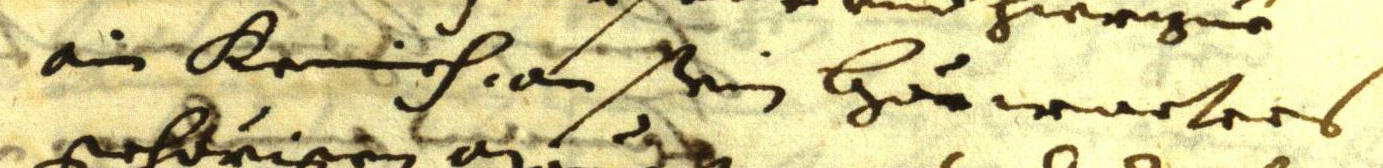ain Kemmich. an sein Hōrwarters
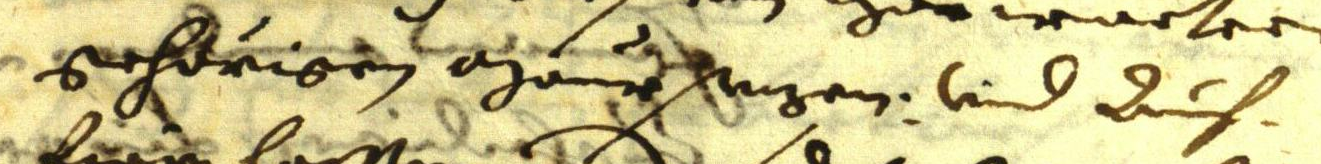gehōrigen Maūr setzen. vnd aūf¬
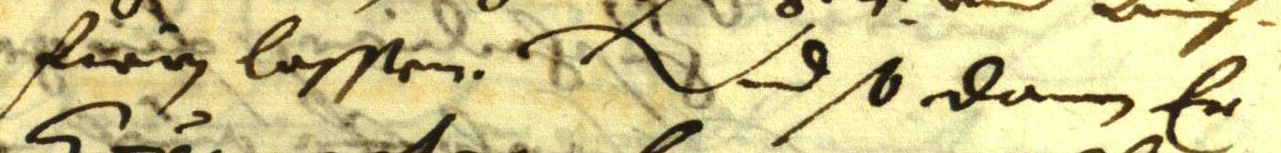fiern lassen. Vnd so dann Er
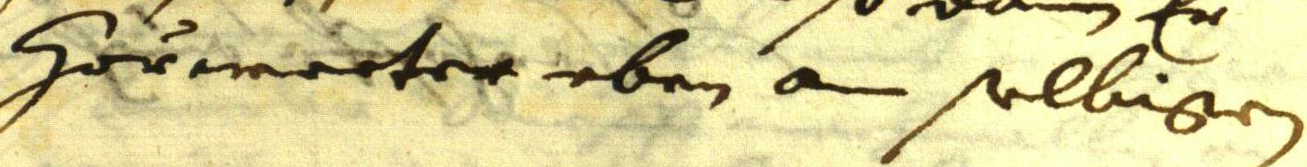Hōrwarter eben am selbigen
